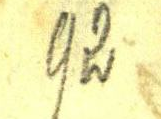92
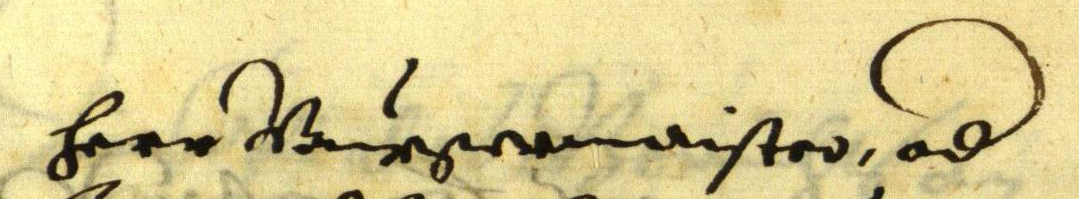herr Būrgermaister, od
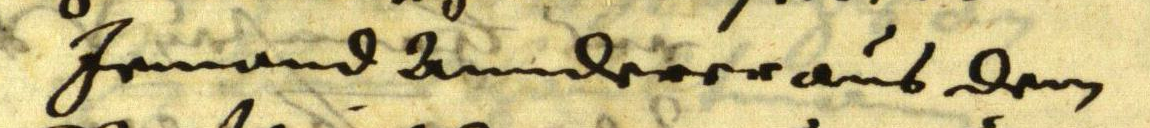Jemand Annderer aūs dem
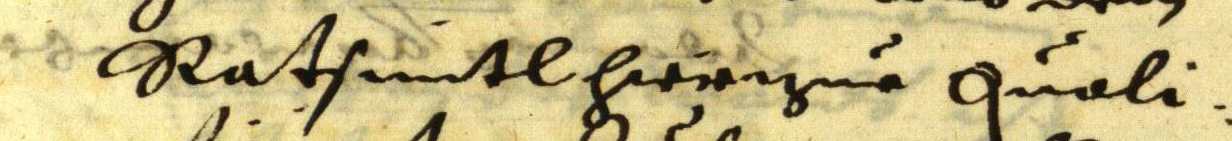Ratsmitl hierzūe qūali¬
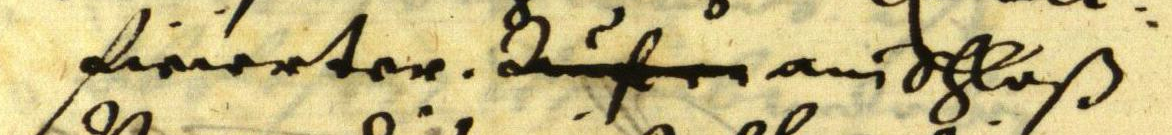ficierter. Aūf en am Schloß
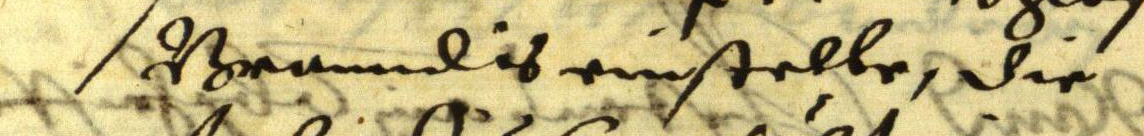Branndis einstelle, die
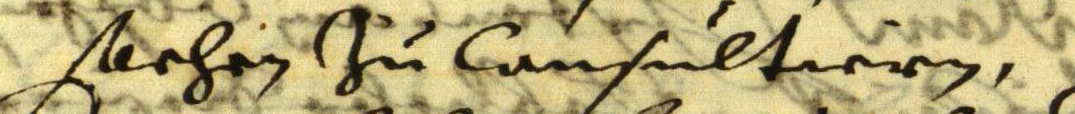sachen Zū Consūltiern,
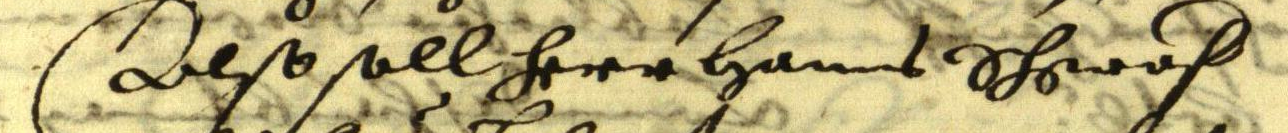Also soll herr Hanns Schgraf
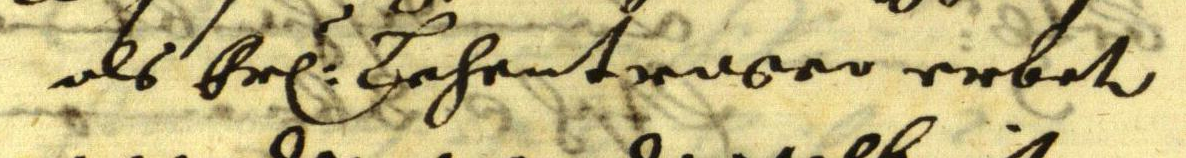als Frl: Lehentrager erbet
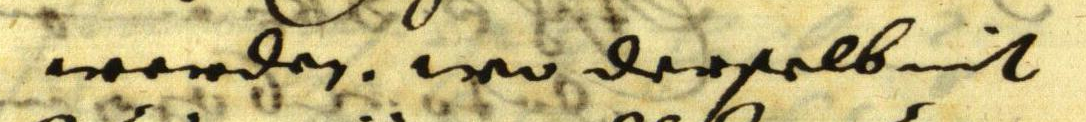werden. wo derselb nit
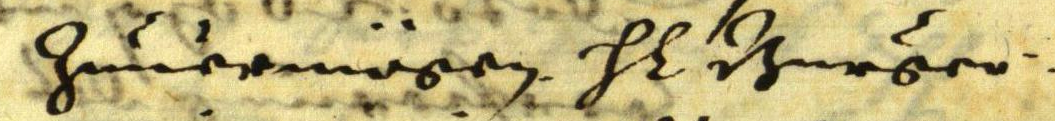Zūūermögen hl Būrger¬
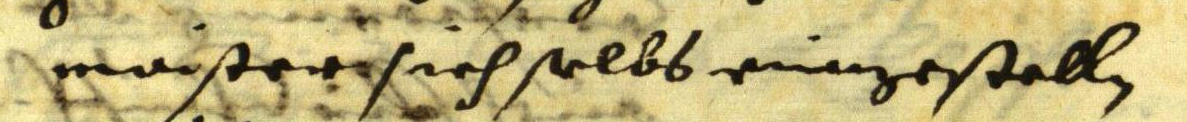maister sich selbs einzestelln
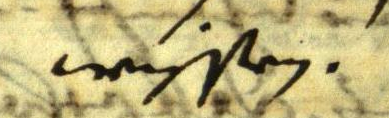wissen.
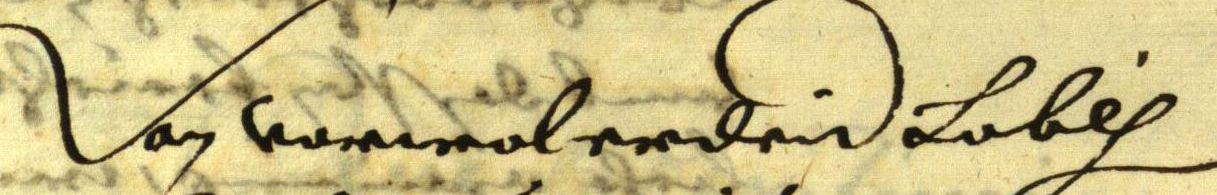Von vorwolerdeit Loblh
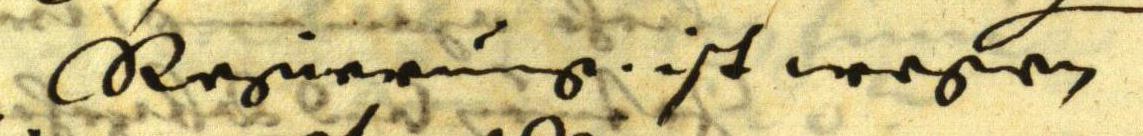Regierūng. ist wegen
